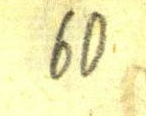60
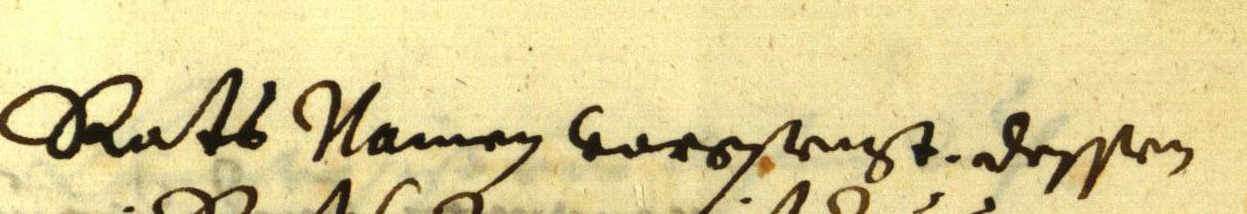Rats Namen vorgesetzt. dessen
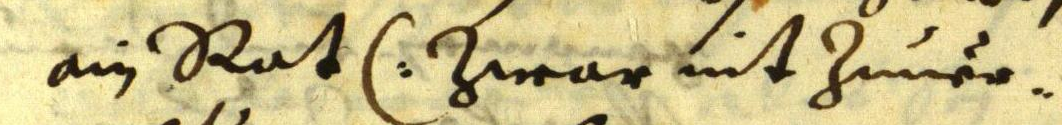ain Rat (: zwar nit Zūuēr¬
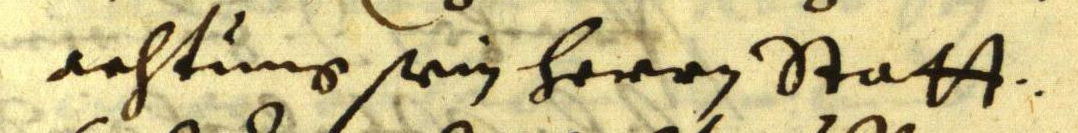achtūng sein herrn Statt¬
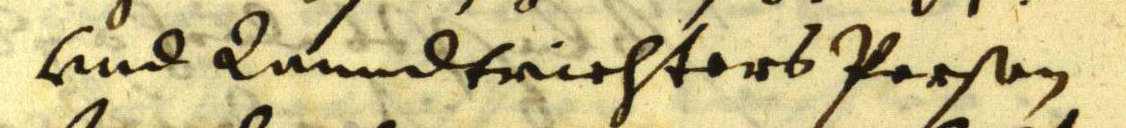vnd Lanndtrichters Person
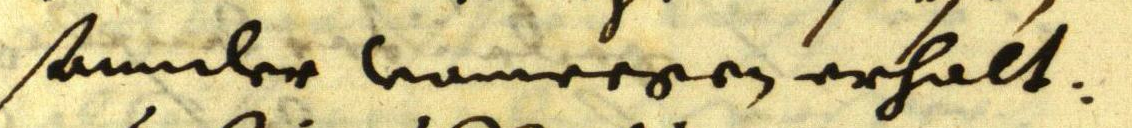sonnder vonwegen erhalt¬
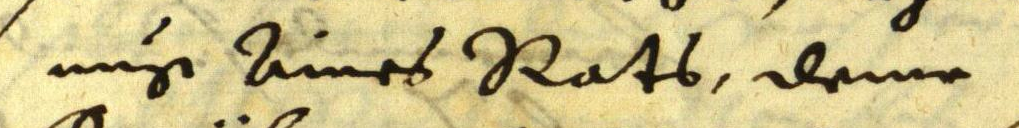ūng Aines Rats, deme
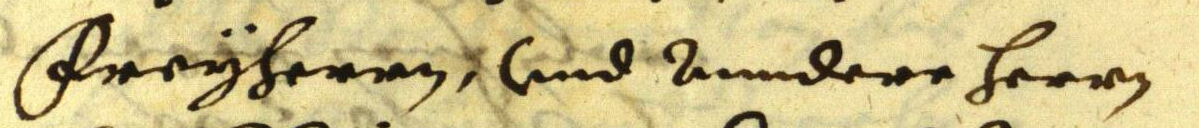Freÿherrn, vnd Anndere herrn
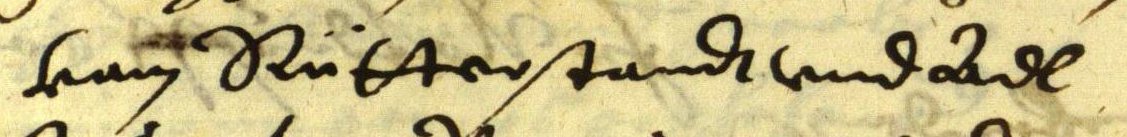vom Rütterstandt vnd Adl
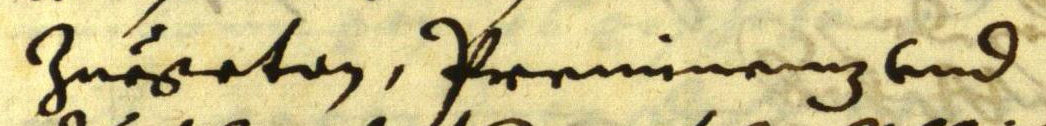Zūegetan, Preminenz vnd
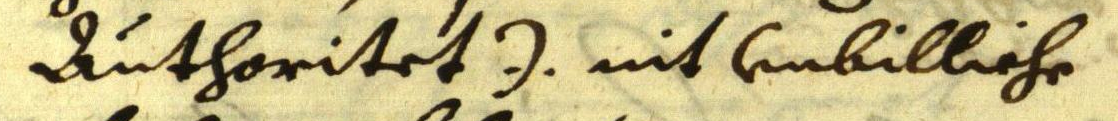Aūthoritet.). nit vnbilliche
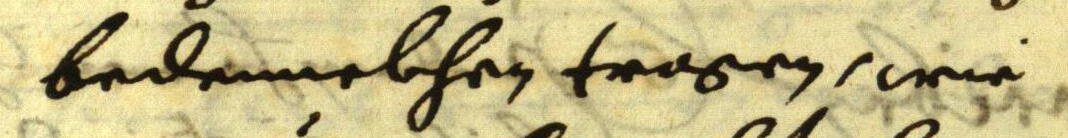bedennckhen tragen, wie
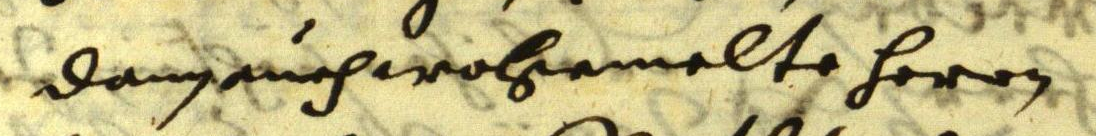dann aūch wolgemelte herrn
